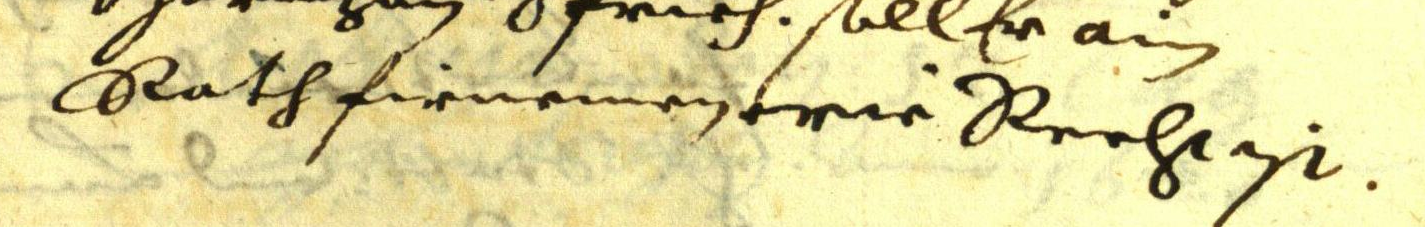Rath firnemen wie Recht ist.
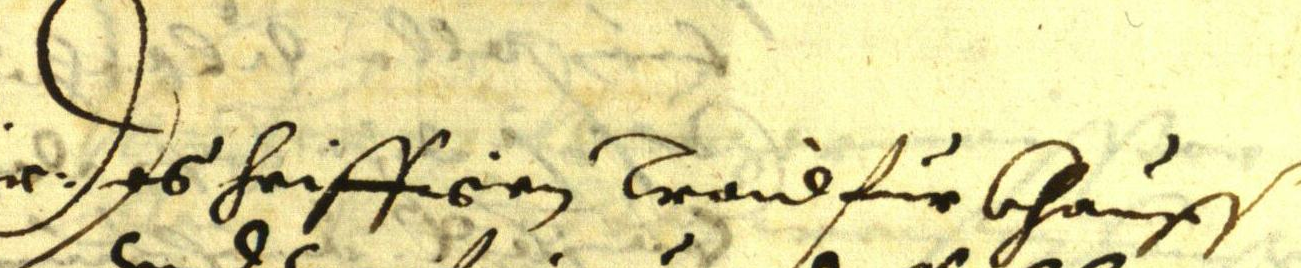Des heiffigen Traid fūr khaūfs
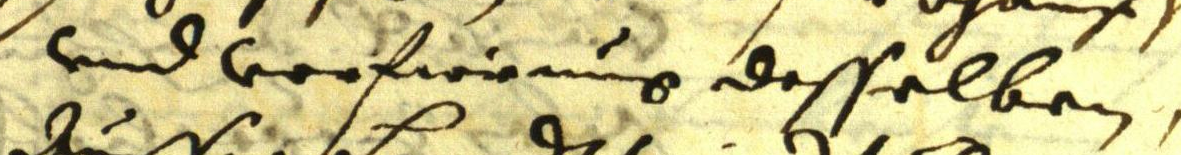vnd verfierūng desselben,
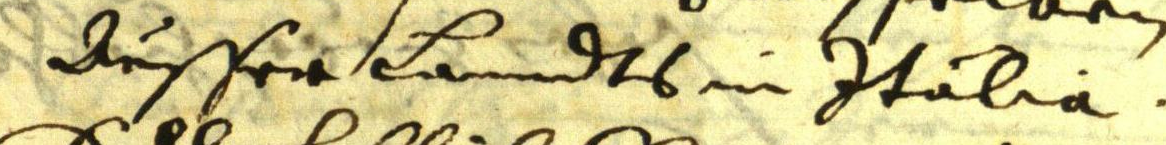Aūsser Lanndts in Itālia.
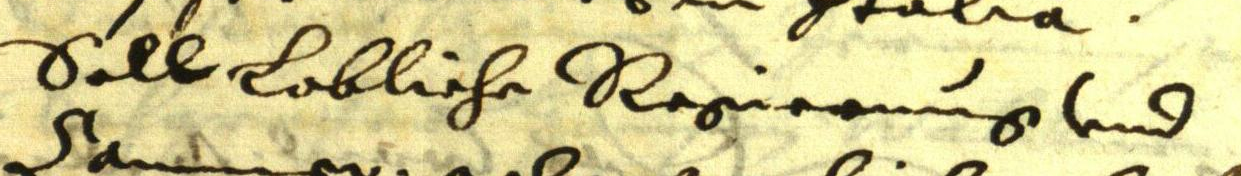Soll Lobliche Regierūng vnd
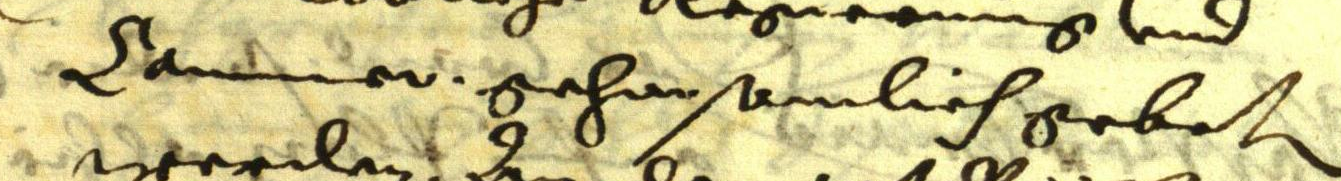Cammer. gehorsamlich gebet
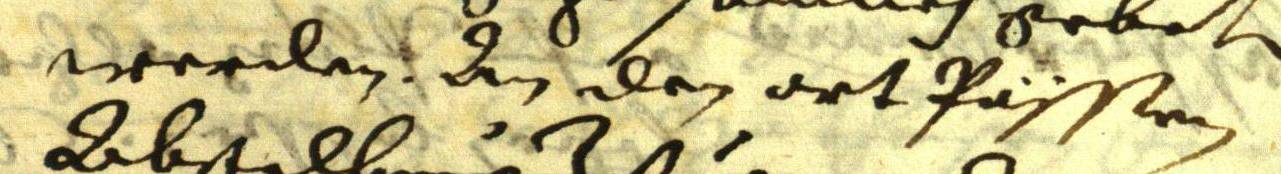werden. An den ort Pässen
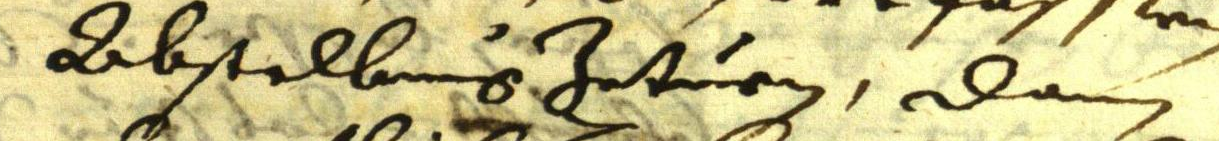Abstellūng Zetūen, dann
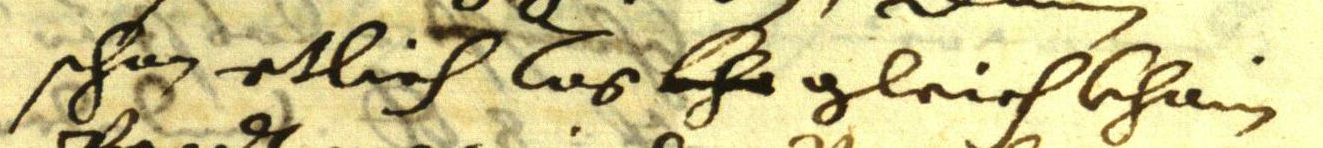schon etlich Tag kha gleich khain
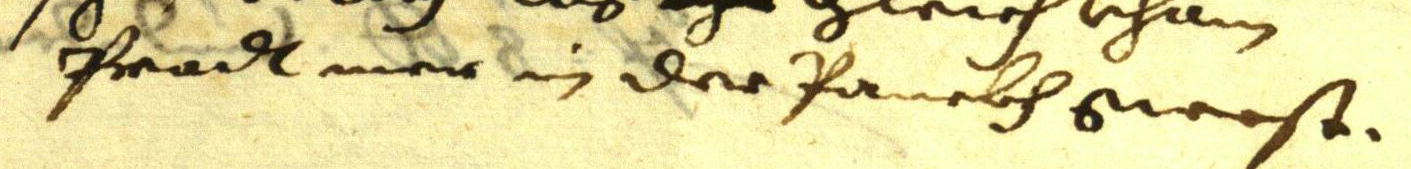Prodt mer in der Panckh gwest.
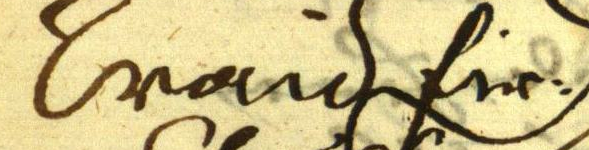Traid fir¬
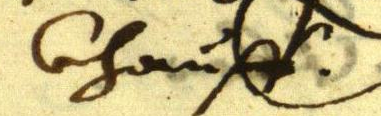khaūff.
